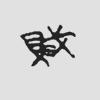{鳥弋}
